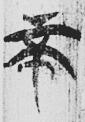不
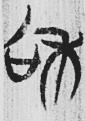和
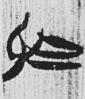於
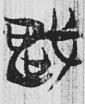○（陳）
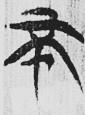不
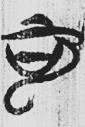可
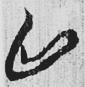㠯
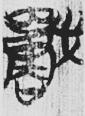○（戰）
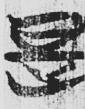是
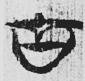古（故）
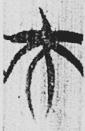夫
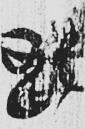○（陳）
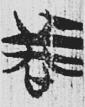者
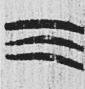三
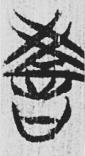教
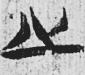之
